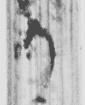人
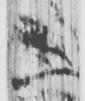之
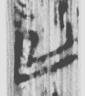亡
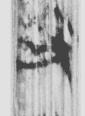又
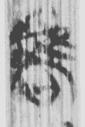唬
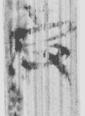皮
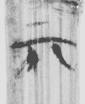亓
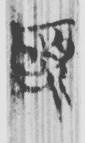匿
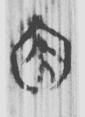因
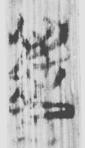逐
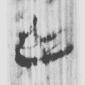臣
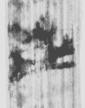至
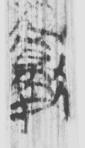獻
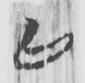㠯（以）
